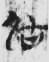居
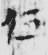凥
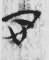名
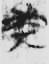族
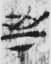至（致）
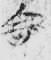命
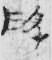阩
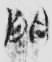門
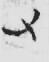又
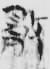敗
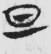旦
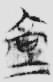塙
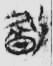戠
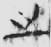之
